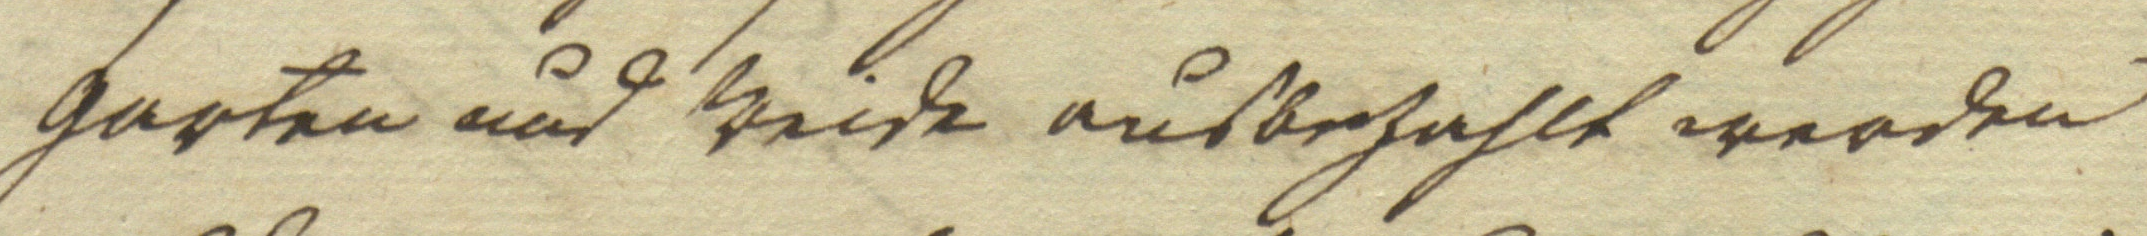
Garten und Weide ausbezahlt werden
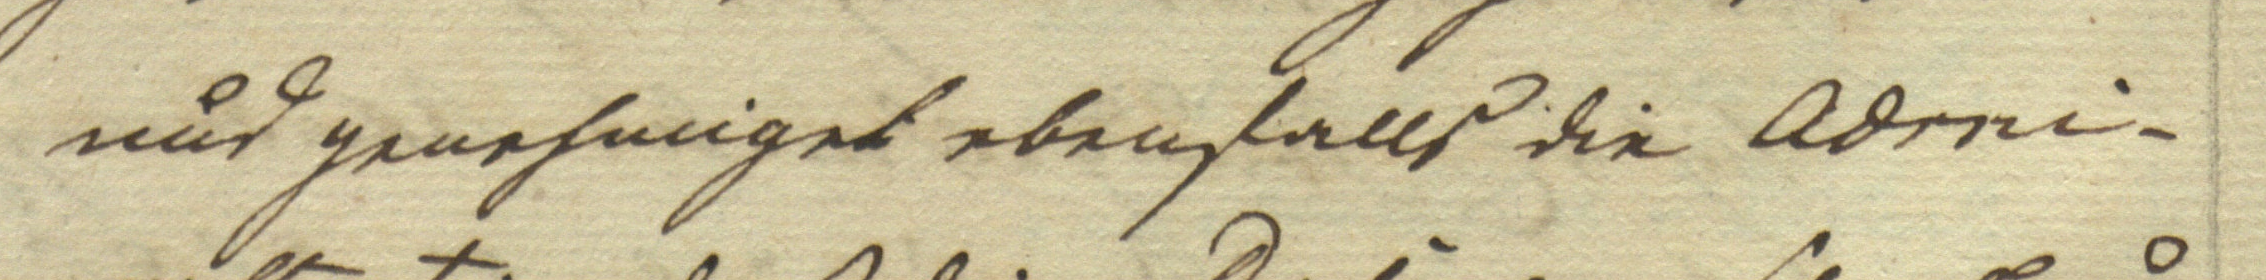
und genehmiget ebenfalls die Admi¬
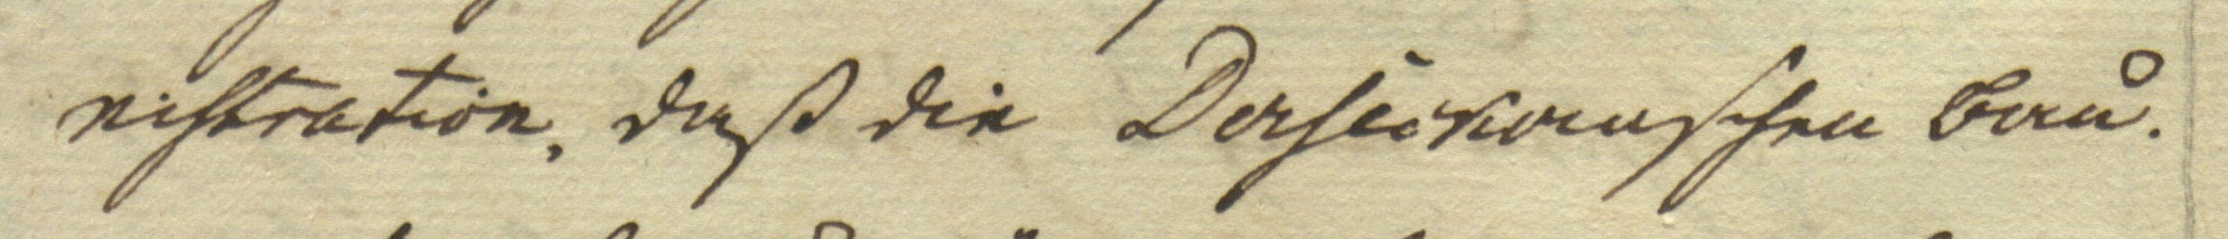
nistration, daß die Derseckowschen Bau¬
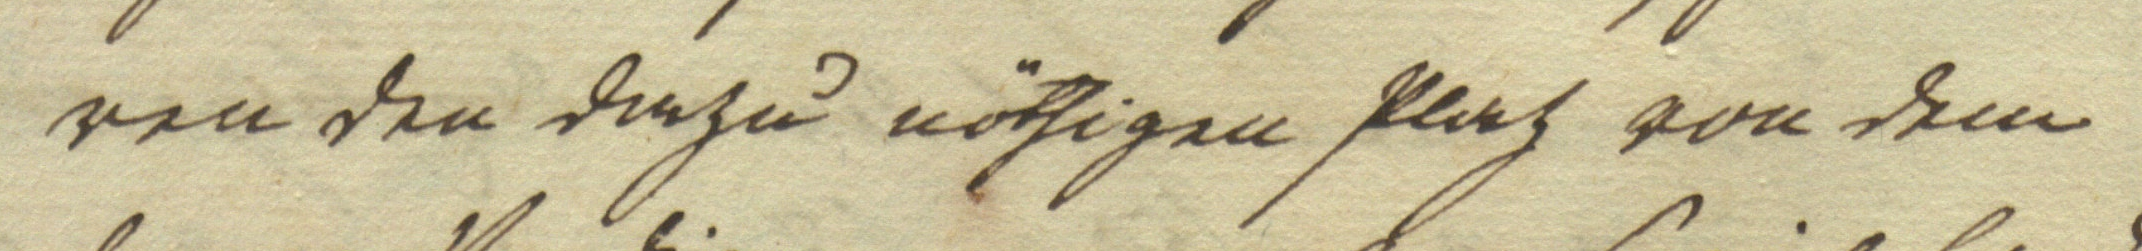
ren den dazu nöthigen Platz von dem
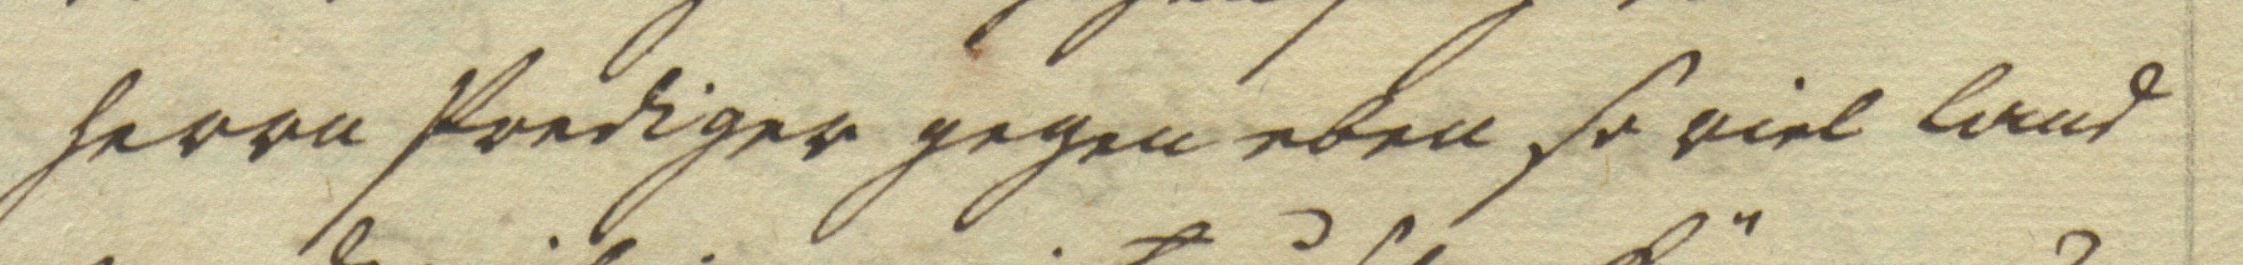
Herrn Prediger gegen eben so viel Land
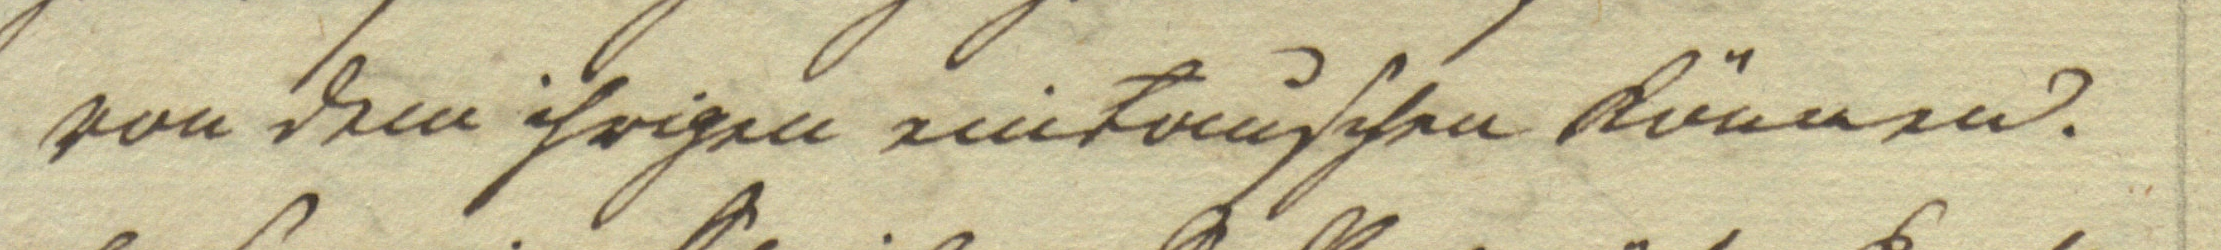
von dem ihrigen eintauschen können.
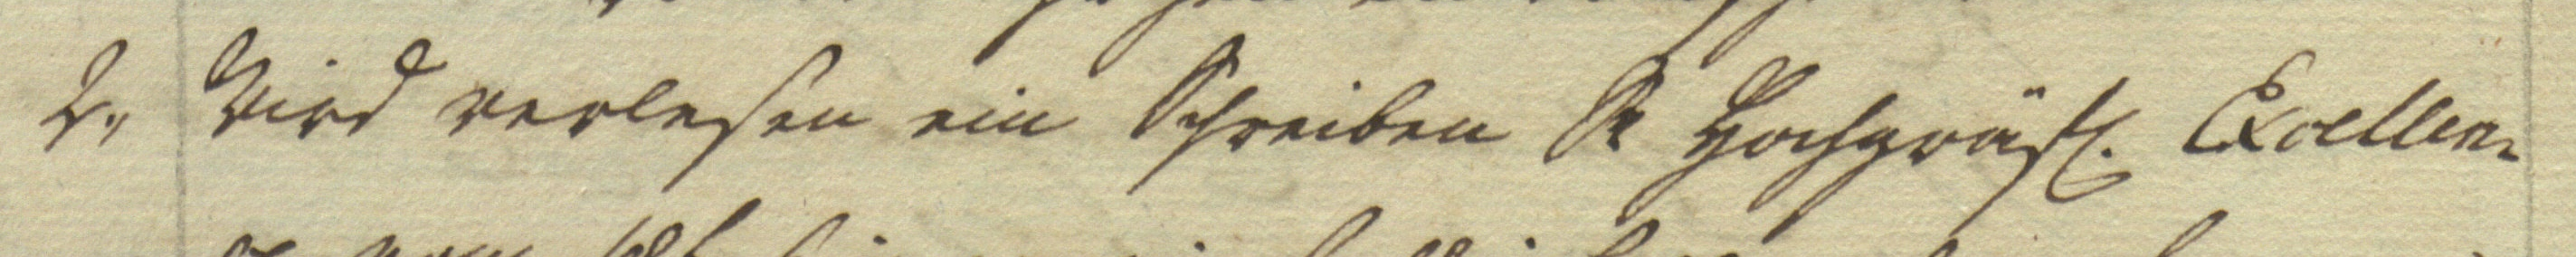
2., Wird verlesen ein Schreiben Sr Hochgräfl. Excellen¬
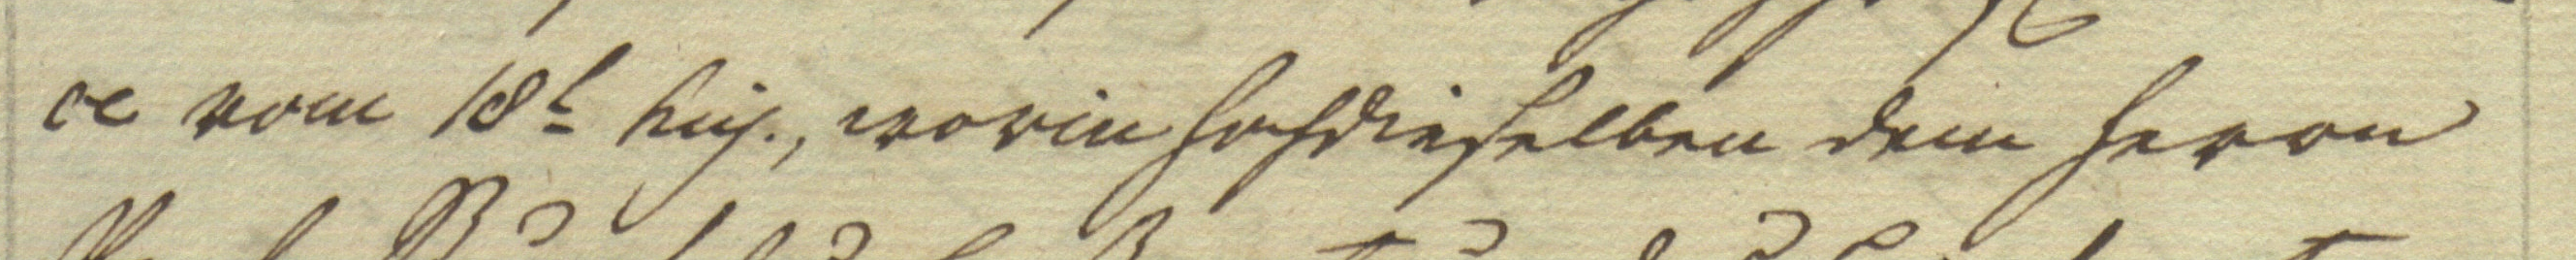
ce vom 18 t huj., worin Hochdieselben dem Herrn
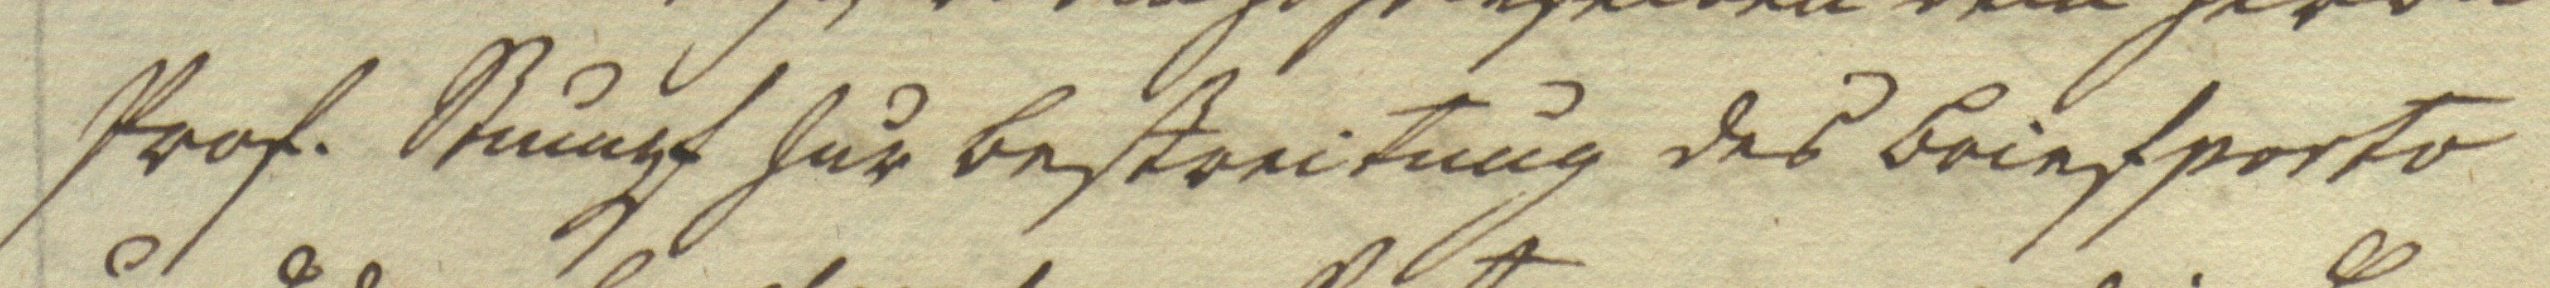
Prof. Stumpf zur Bestreitung des Briefporto
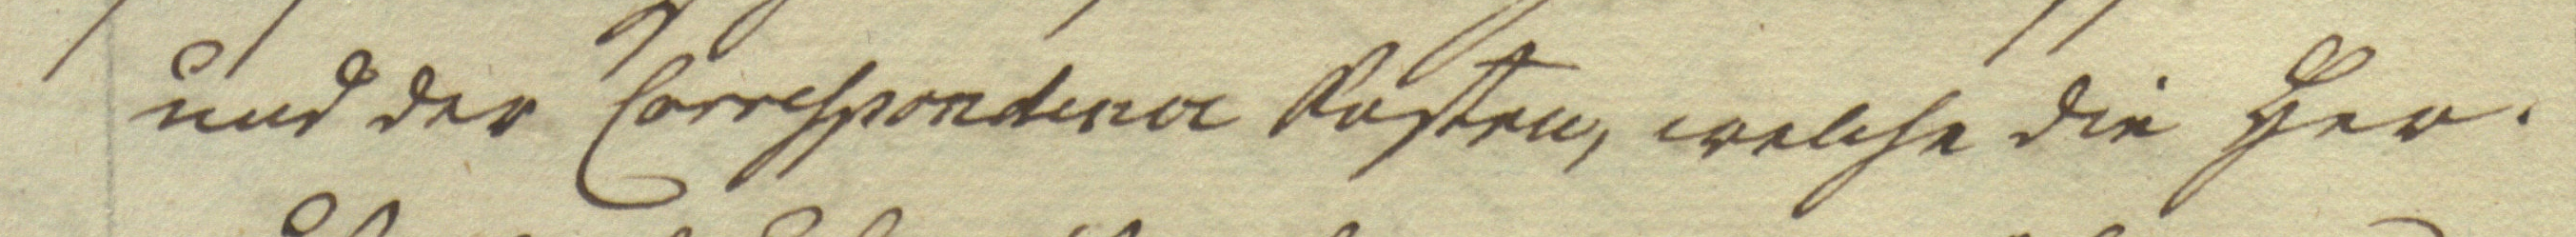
und der Correspondencekosten, welche die Her¬
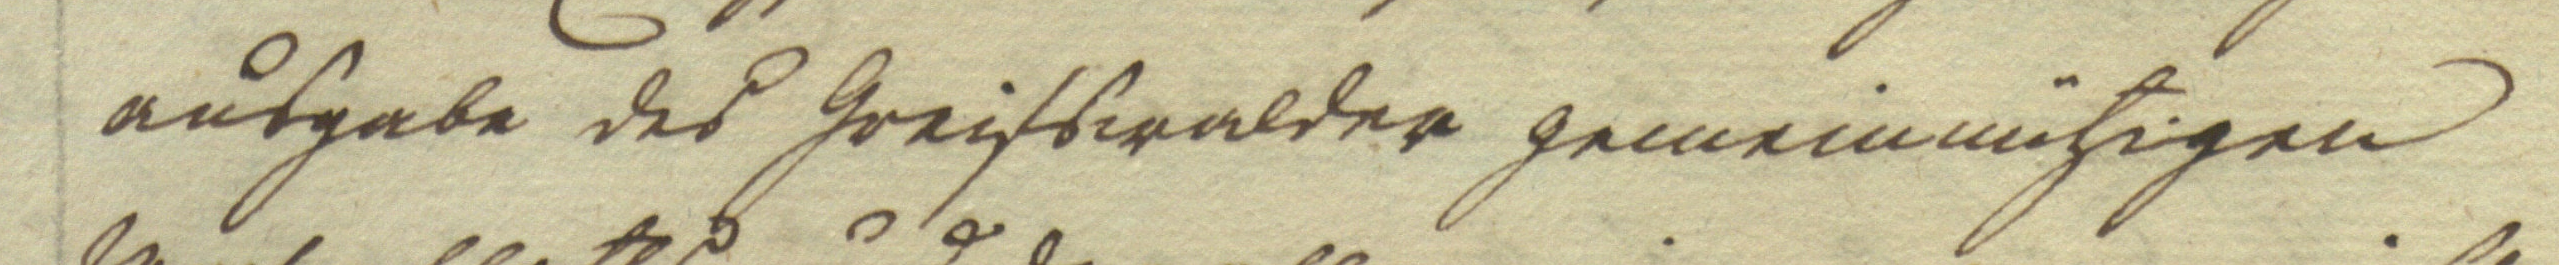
ausgabe des Greifswalder gemeinnützigen
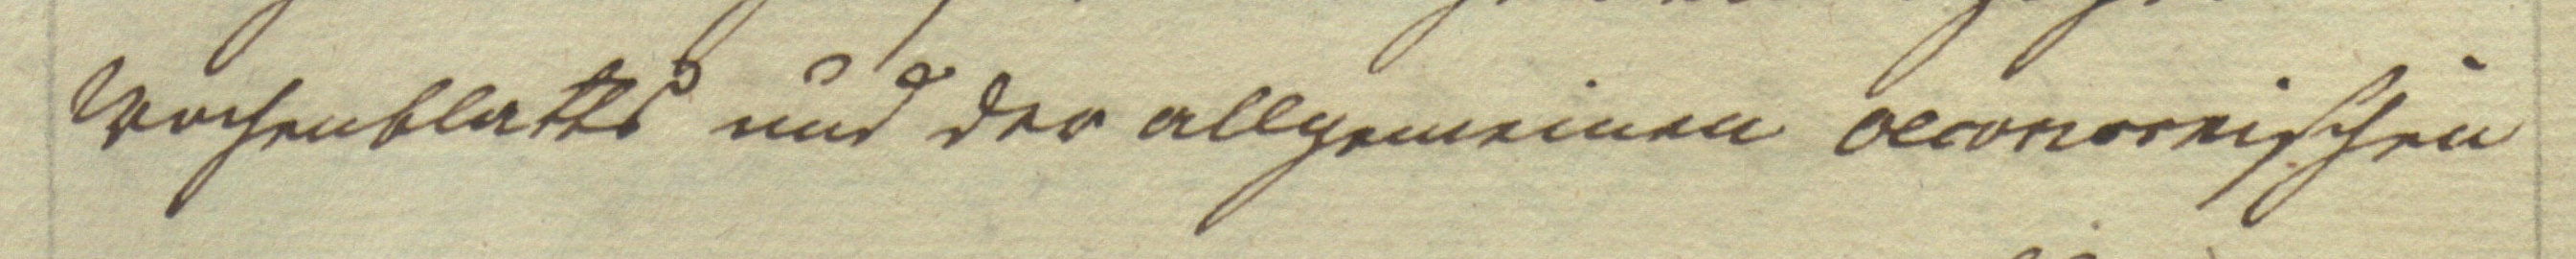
Wochenblatts und der allgemeinen oeconomischen
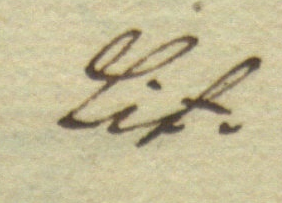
Lit¬
